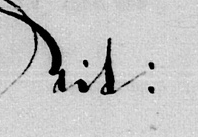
Tit:
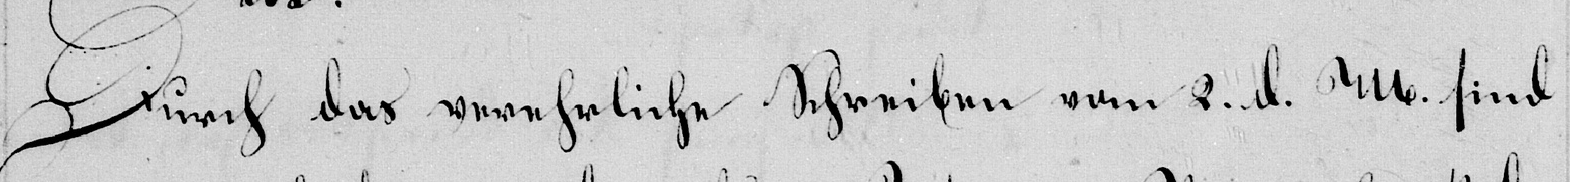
Durch das verehrliche Schreiben vom 2. d. M. sind
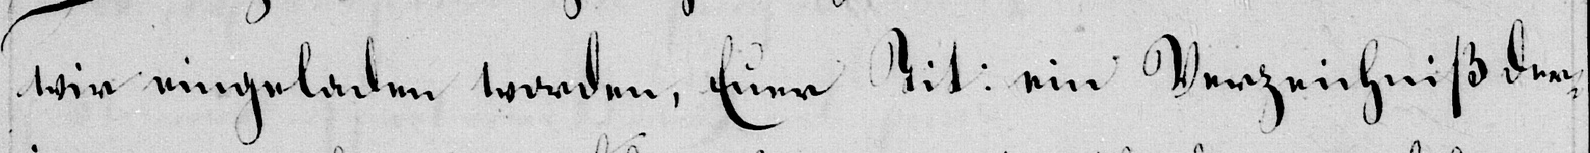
wir eingeladen worden, Euer Tit: ein Verzeichniß der¬
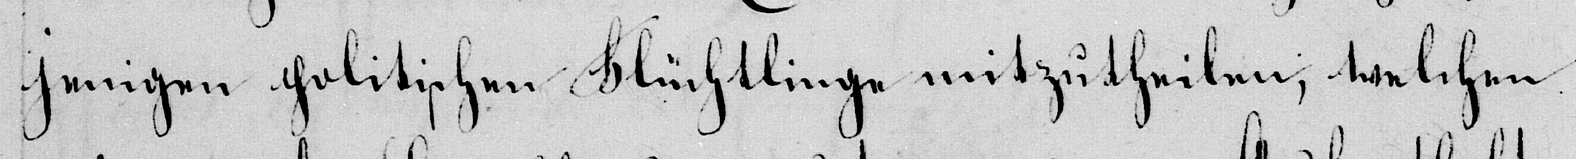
jenigen politischen Flüchtlinge mitzutheilen, welchen
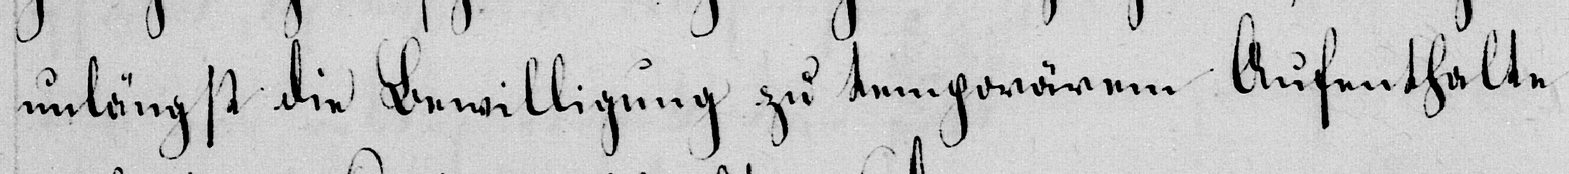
unlängst die Bewilligung zu temporärem Aufenthalt
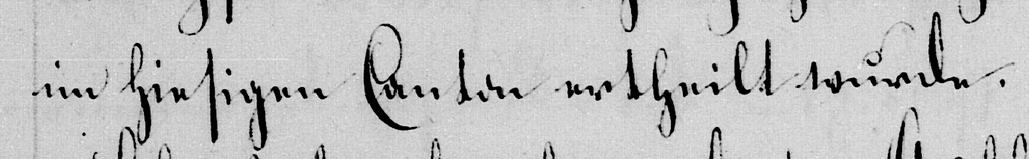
im hiesigen Cantons ertheilt wurde.
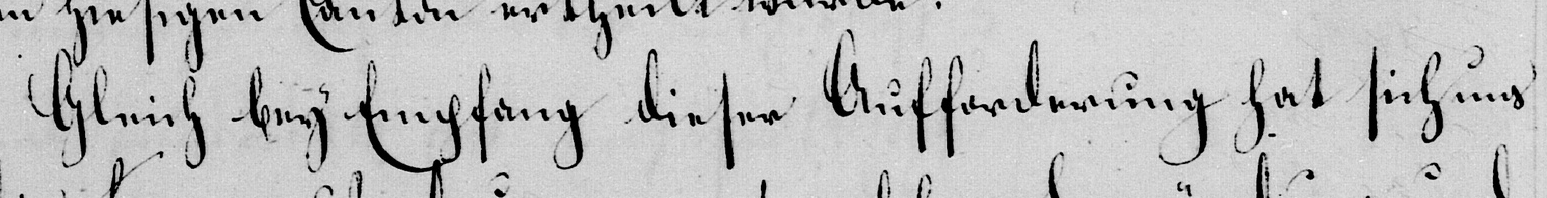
Gleich bey Empfang dieser Aufforderung hat sich uns
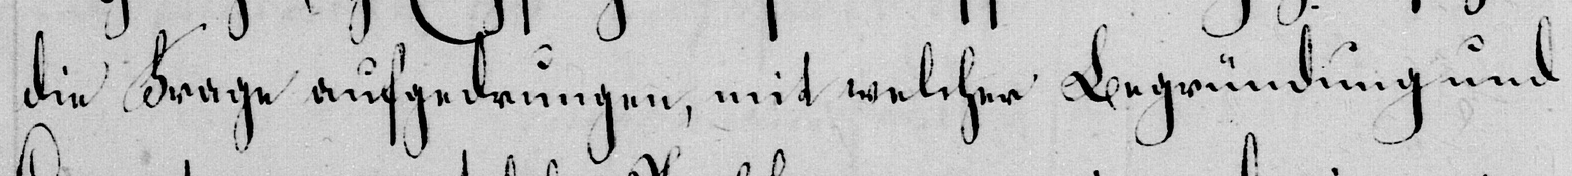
die Frage aufgedrungen, mit welcher Begründung und
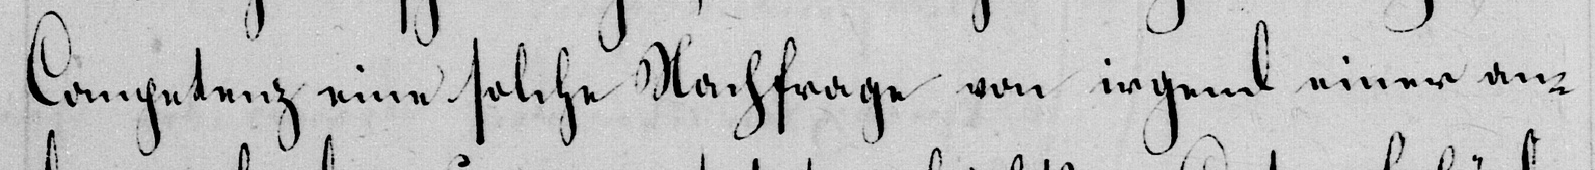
Competenz eine solche Nachfrage von irgend einer an¬
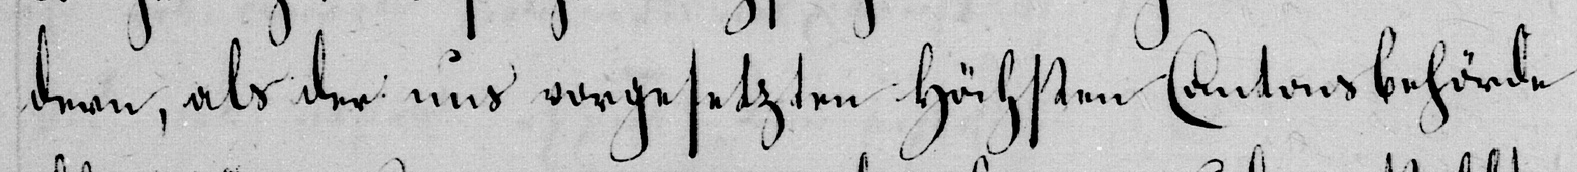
dern, als der uns vorgesetzten Höchsten Cantonsbehörde
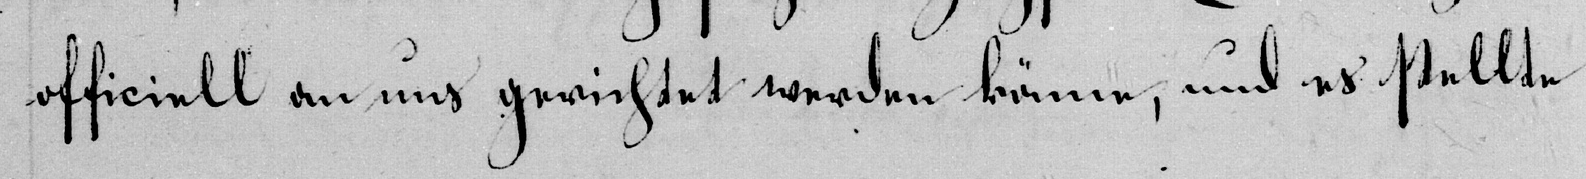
officiell an uns gerichtet werden könne, und es stellte
